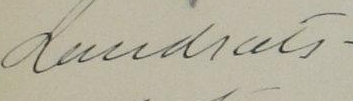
Landrats
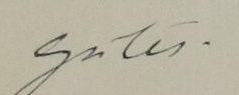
güter
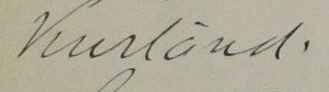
Kurländ.
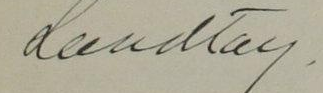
Landtag
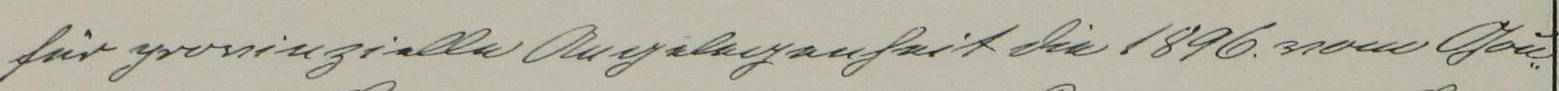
für provinzielle Angelegenheit die 1896. vom Gou-
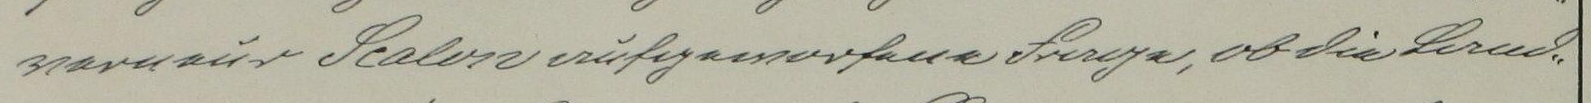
verneur Scalon aufgeworfene Frage, ob die Land-
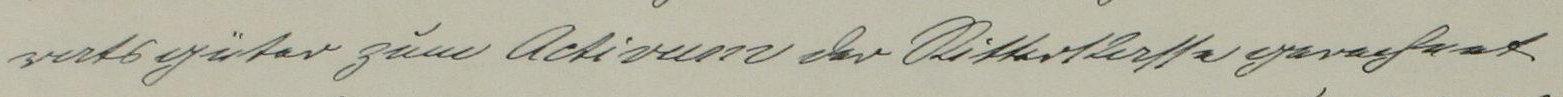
ratsgüter zum Activum der Ritterkasse gerechnet
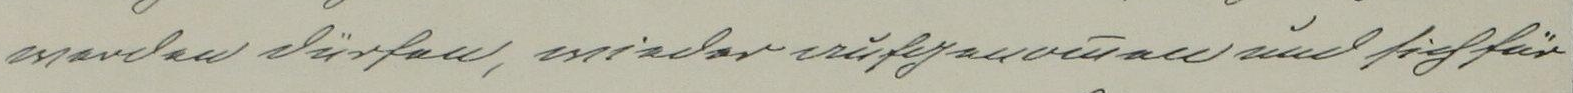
werden dürfen, wieder aufgenommen und sich für
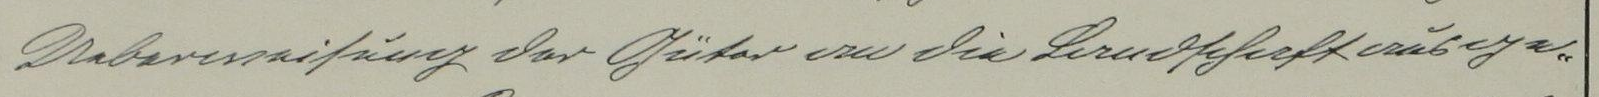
Ueberweisung der Güter an die Landschaft ausge-
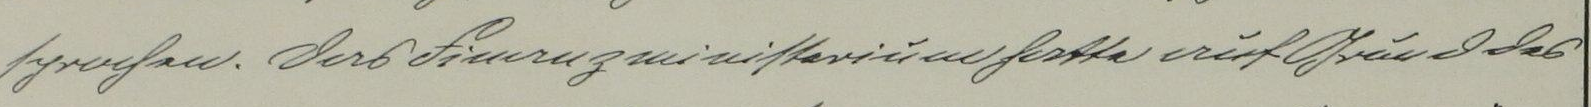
sprochen. Das Finanzministerium hatte auf Grund des
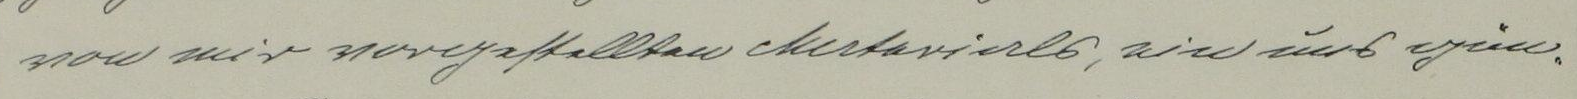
von mir vorgestellten Materials, ein uns gün-
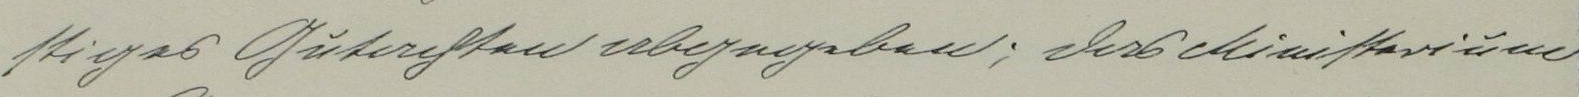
stiges Gutachten abgegeben; das Ministerium
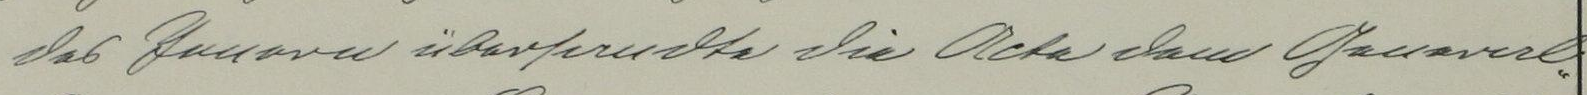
des Innern übersandte die Acte dem General-
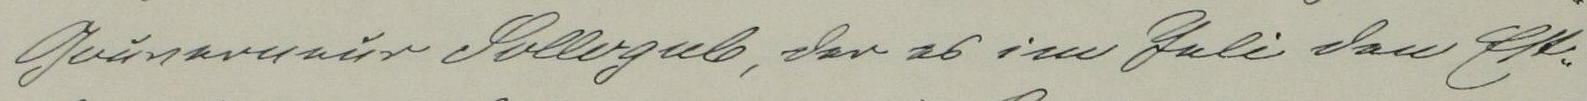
Gouverneur Sollogub, der es im Juli dem Est-
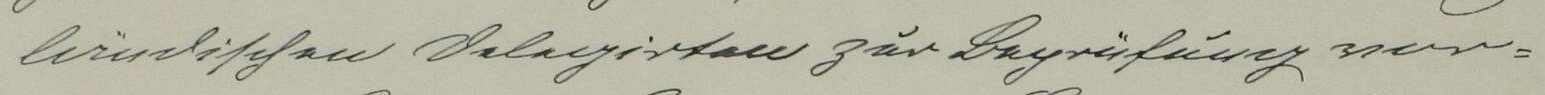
ländischen Delegirten zur Beprüfung vor-
